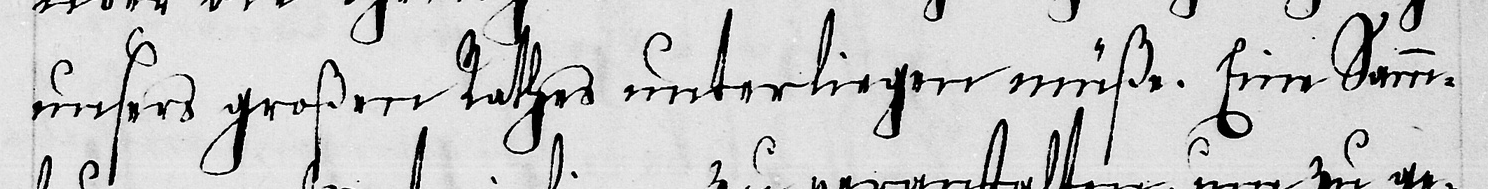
unsers Großen Rathes unterliegen müße. Eine Samm¬
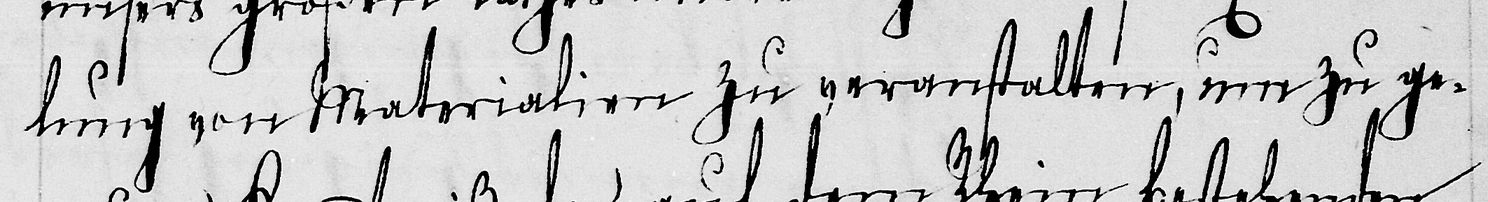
lung von Materialien zu veranstalten, um zu ge¬
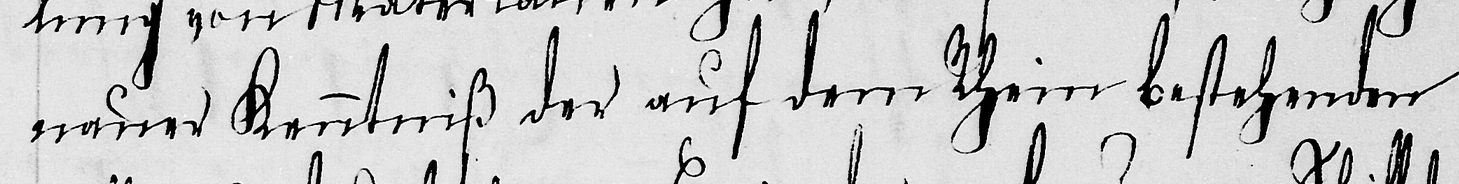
nauer Kenntniß der auf dem Rhein bestehender
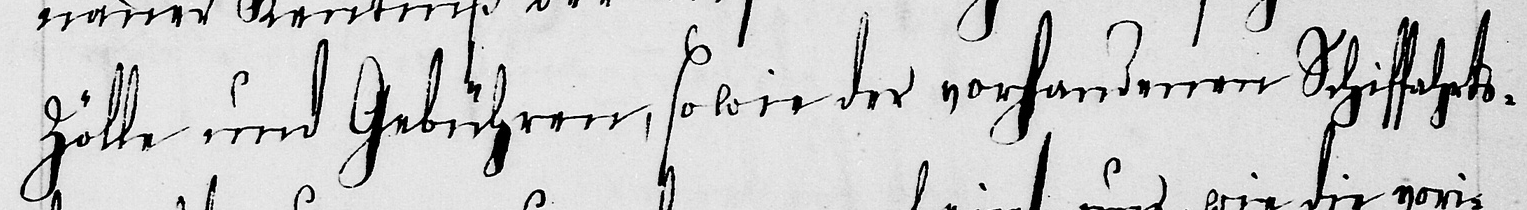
Zölle und Gebühren, sowie der vorhandenen Schiffahrt¬
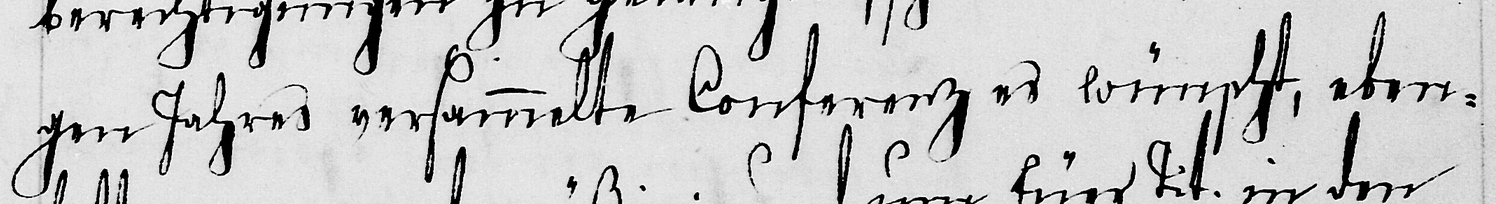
gen Jahres versammelte Conferenz es wünscht, eben¬
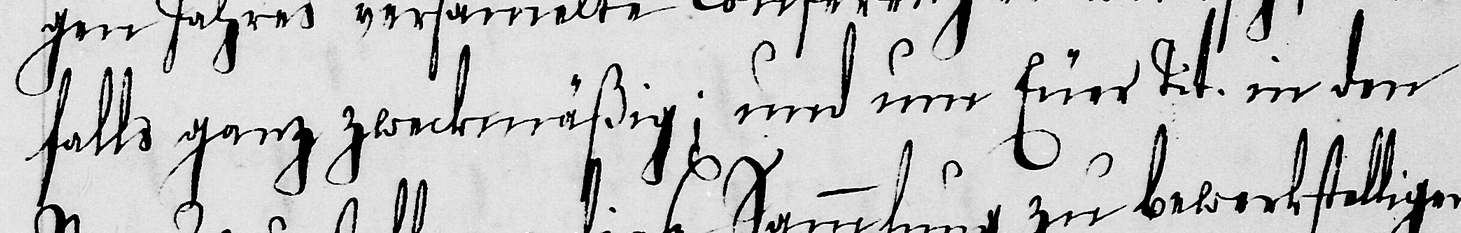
falls ganz zweckmäßig; und um Euer Tit. in den
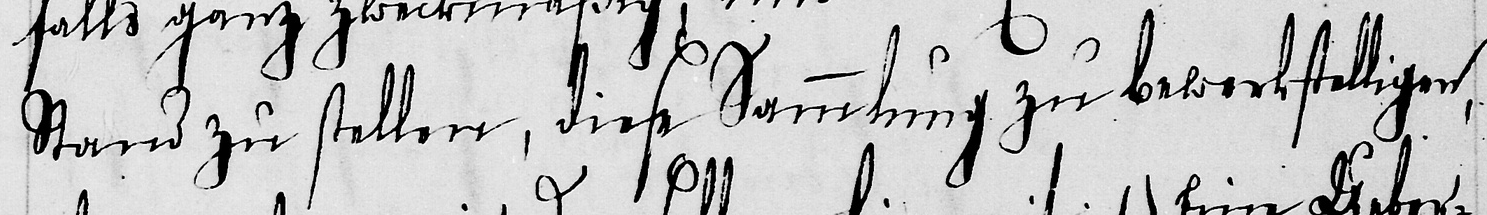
Stand zu stellen, diese Sammlung zu bewerkstelligen,
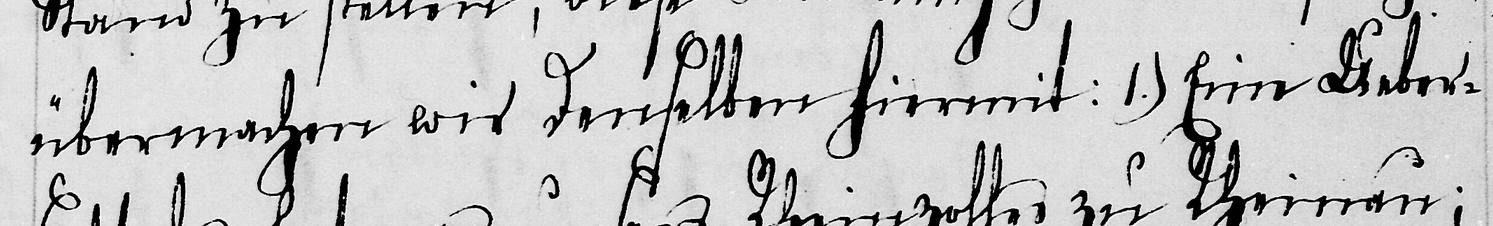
übermachen wir Denselben hiermit: 1.) Eine Ueber¬
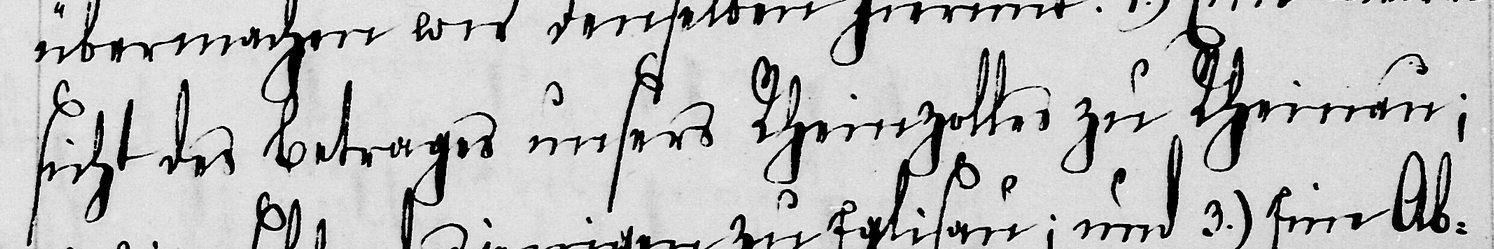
sicht des Betrages unsers Rheinzolles zu Rheinau;
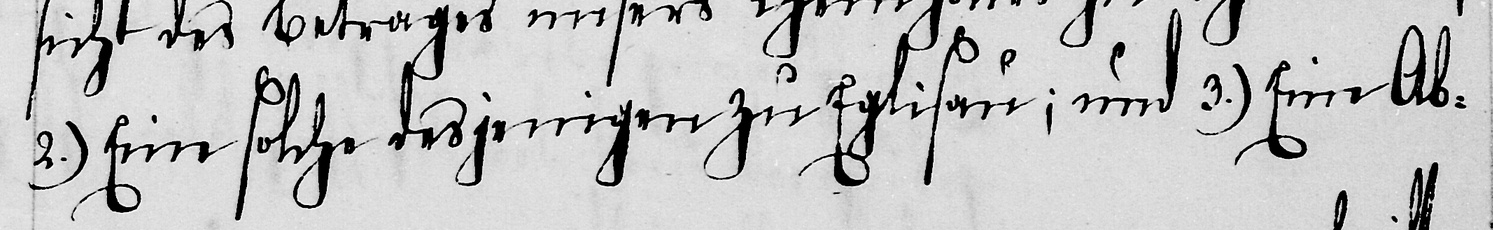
2.) Eine solche desjenigen zu Eglisau; und 3.) Eine Ab-
